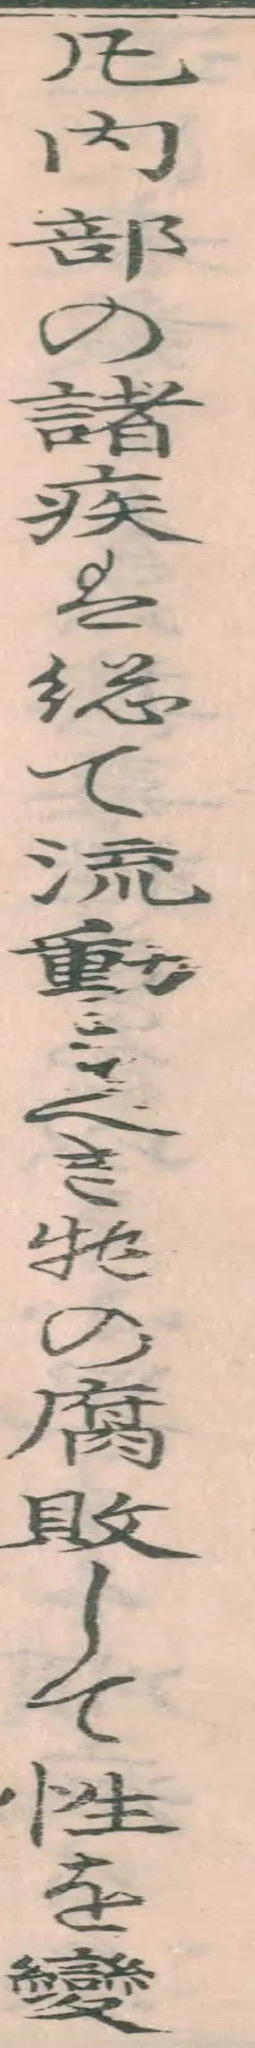凡内部の諸疾は總て流動すべき物の腐敗して性を變
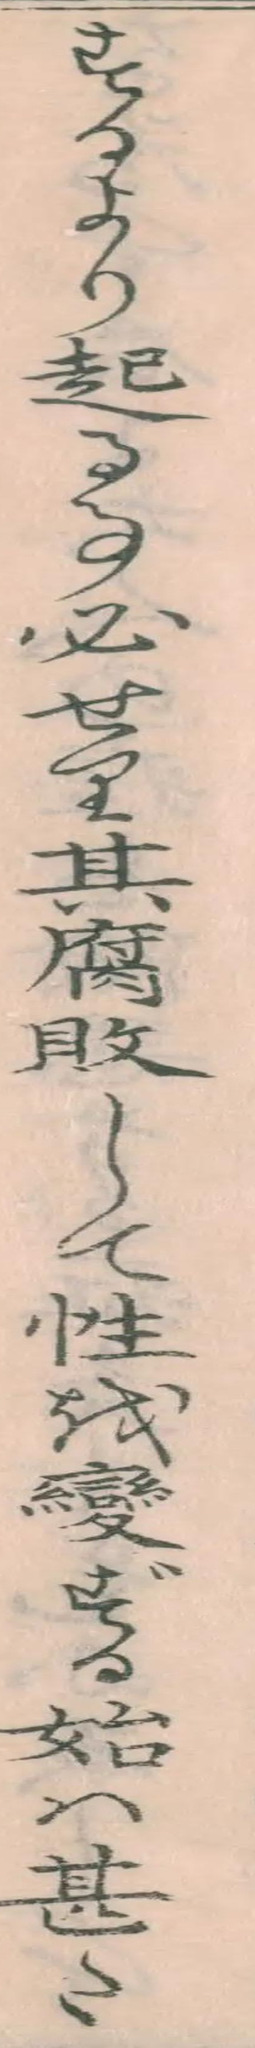するより起る事必せり其腐敗して性を變ずる始は甚た
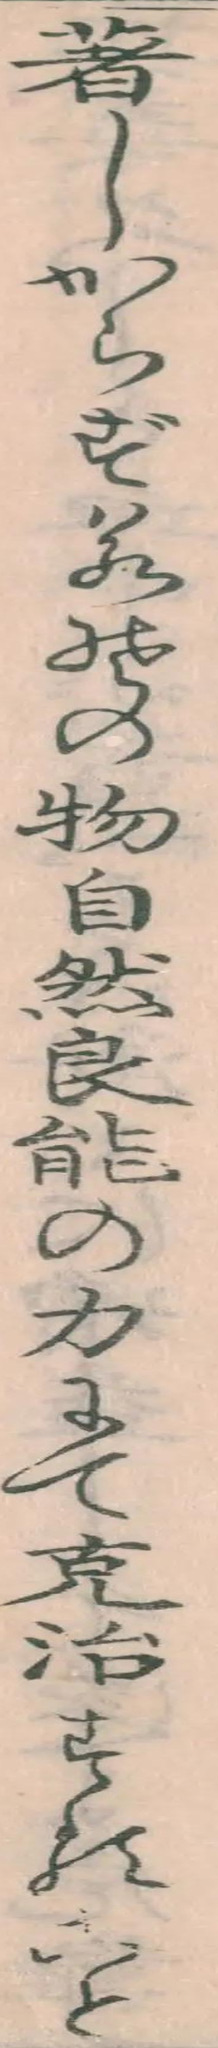著しからず若その物自然良能の力にて克治すること
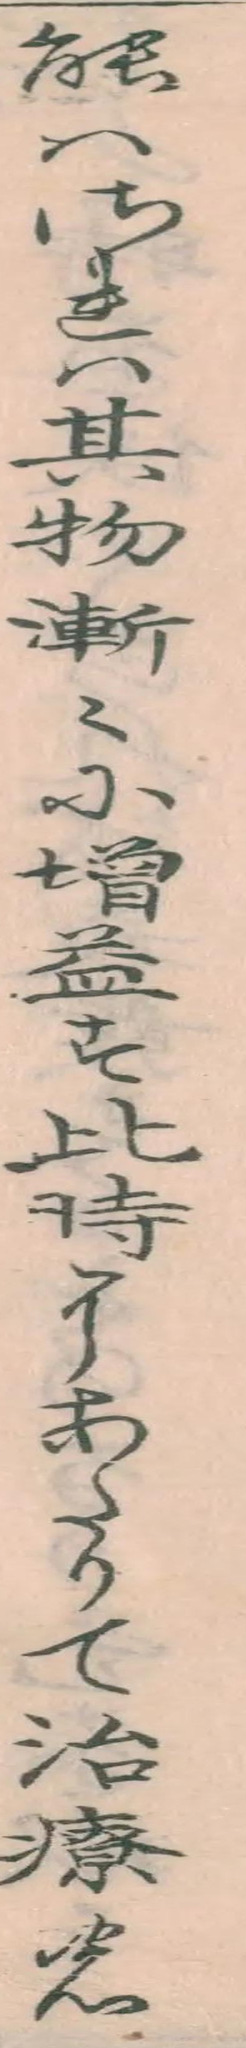能は御りれは其物漸々に増益す此特にあたりて治療の
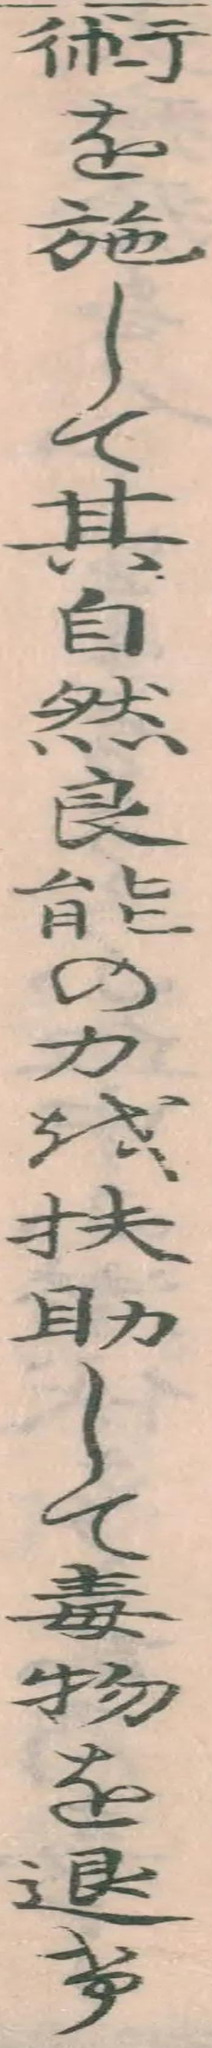術を施して其自然良能の力を扶助して毒物を退け
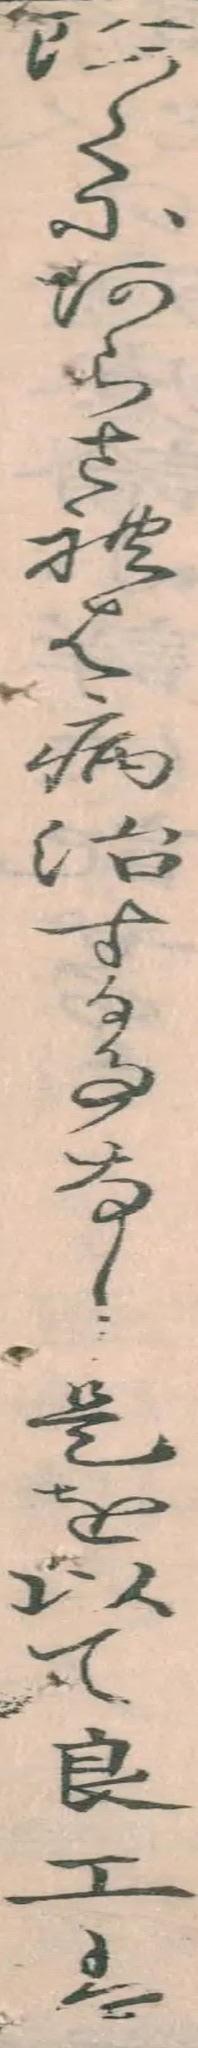あくにあらされは病治する事なし是を以て良工は
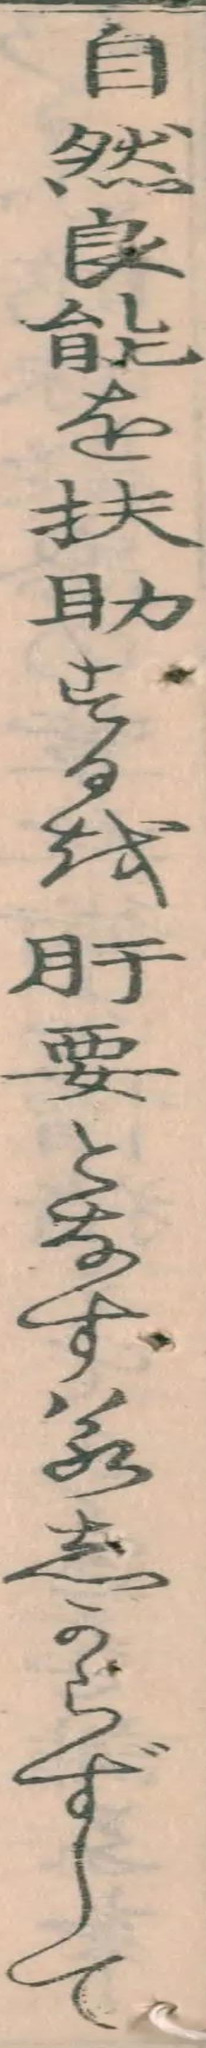自然良能を扶助するを肝要となす為しからずして
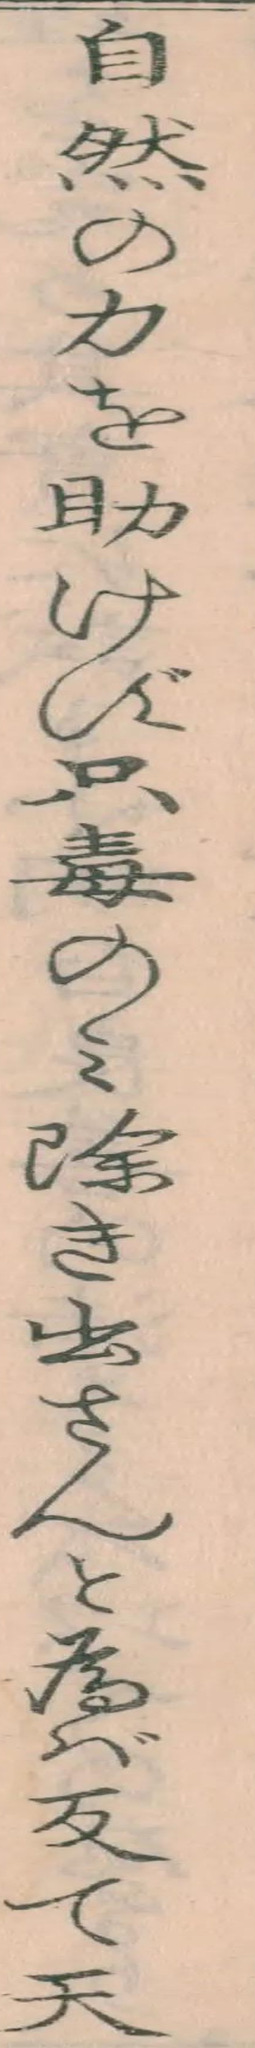自然の力を助けず只毒のみ除き出さんと為ば反て天
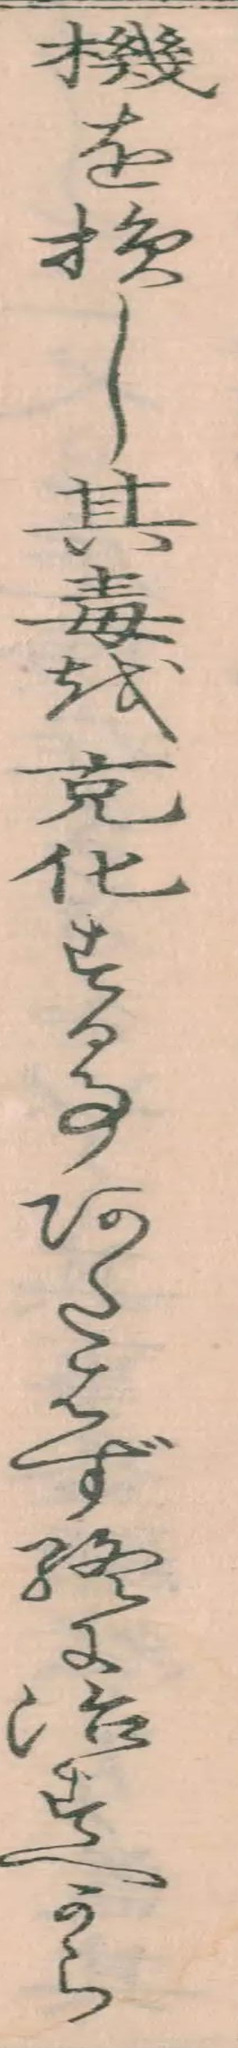機を損し其毒を克化する事あたはず終に治すへから
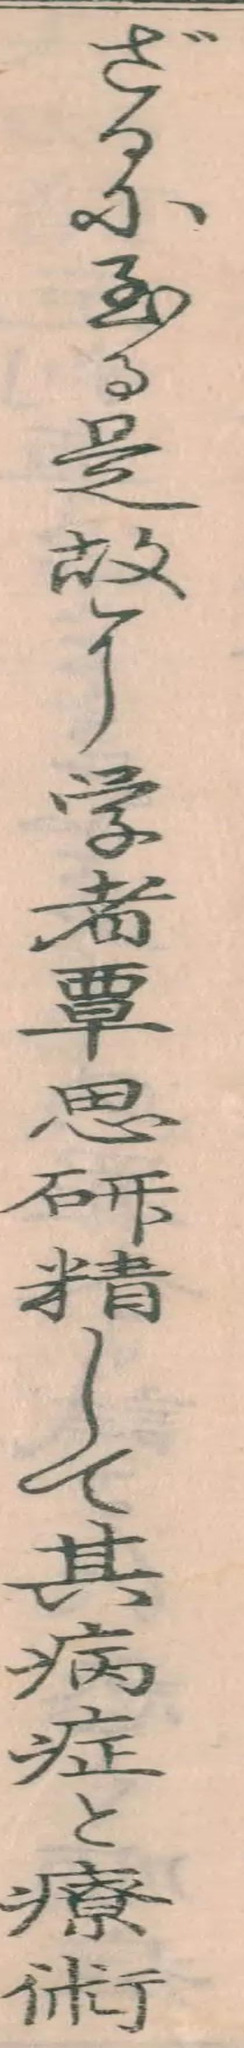ざるに至る是故に学者覃思研精して其病症と療術
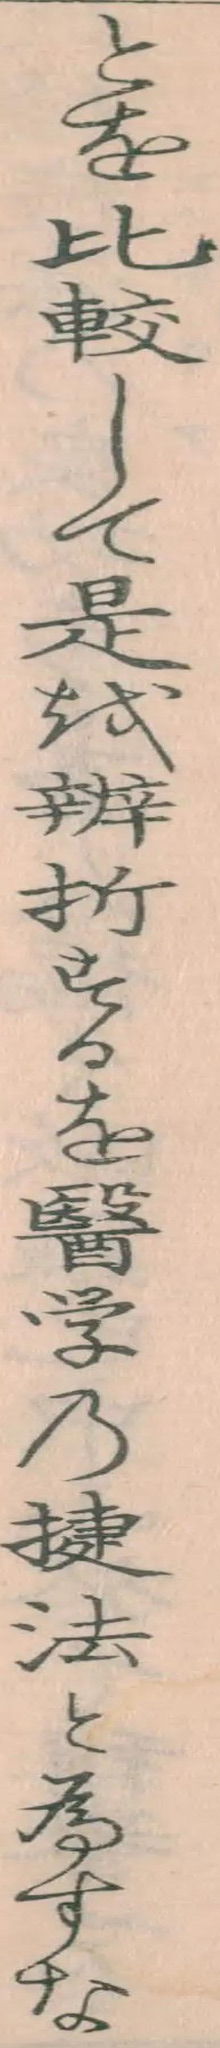とを比較して是を辨折するを醫学の捷法と為すな
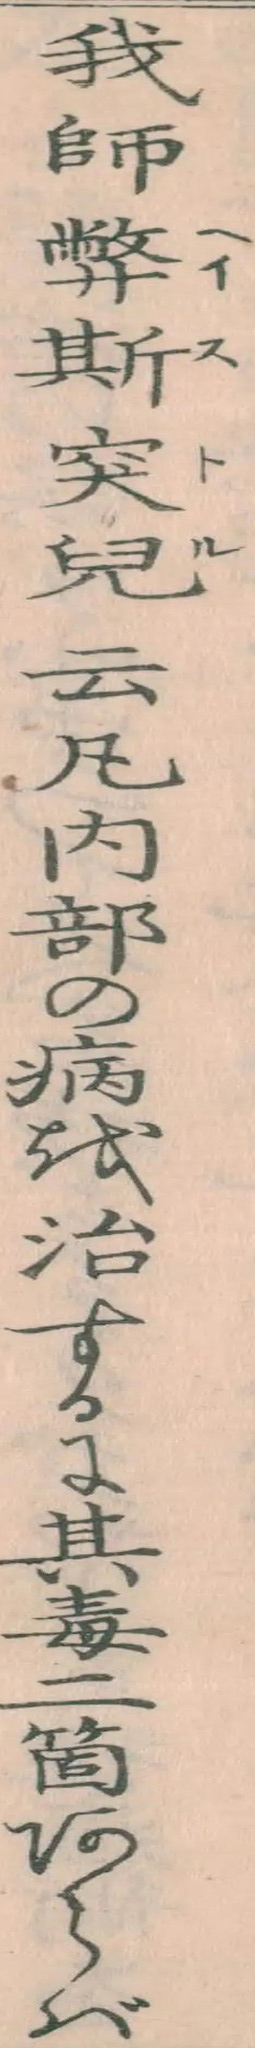我師幣斯突兒云凡内部の病を治するに其毒二箇あらば
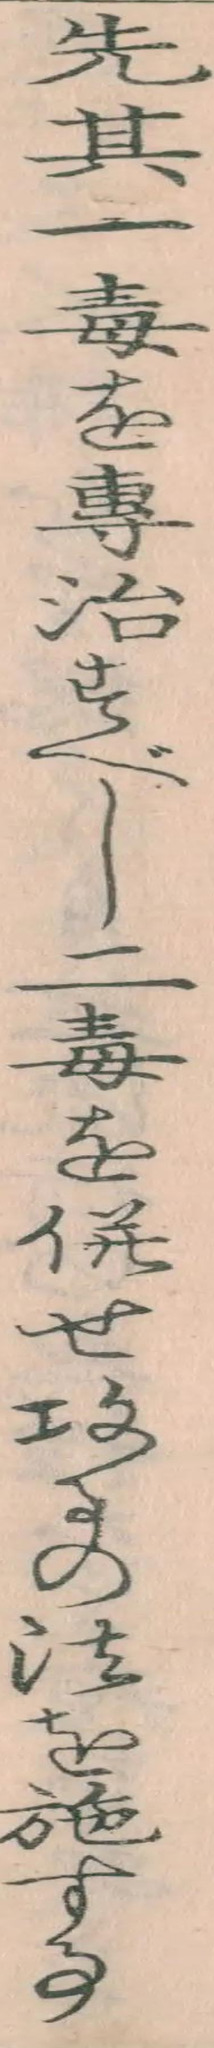先其一毒を専治すべし二毒を併せ攻るの法を施す事
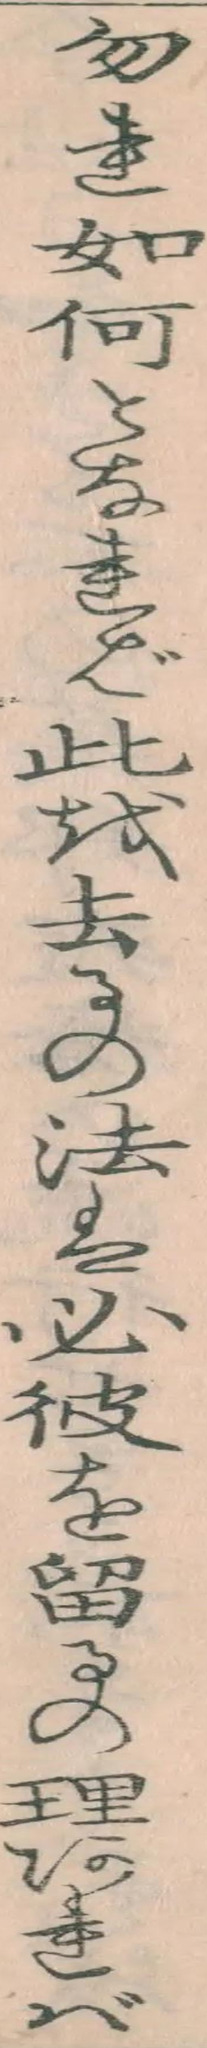勿れ如何となれば此を去るの法は必彼を留るの理あれば
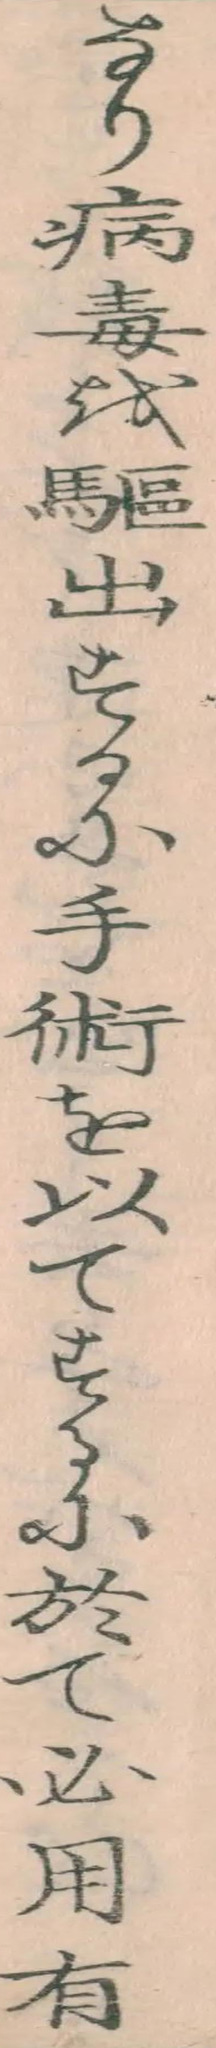なり病毒を駆出するに手術を以てすくふに於て必用有
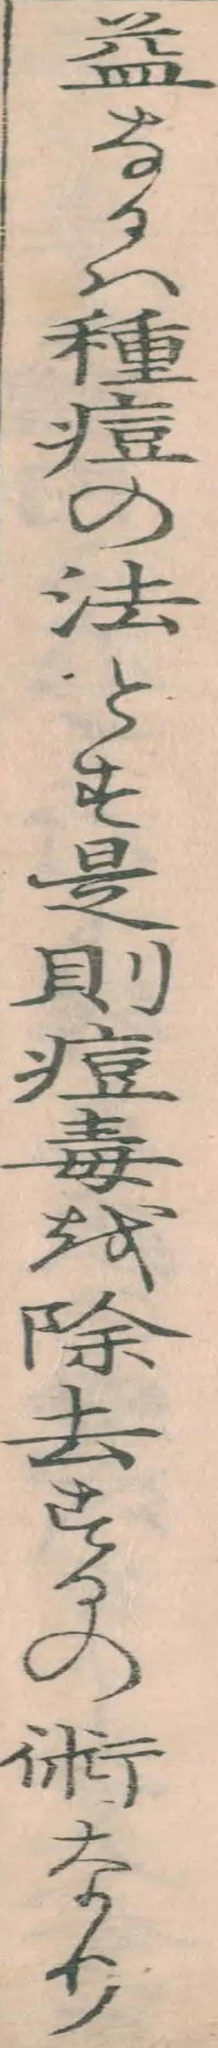益なるは種痘の法とす是則痘毒を除去するの術なり
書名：種痘新編
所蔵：国立国会図書館 National Diet Library, JAPAN
